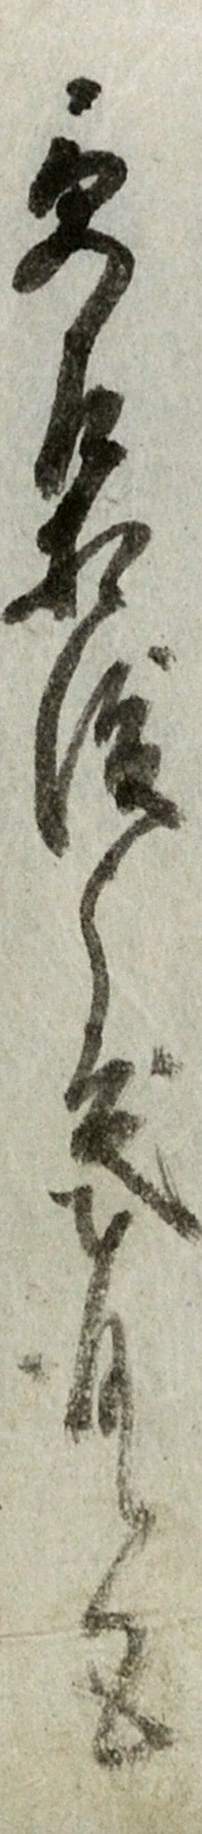受取相渡申度奉存候以上
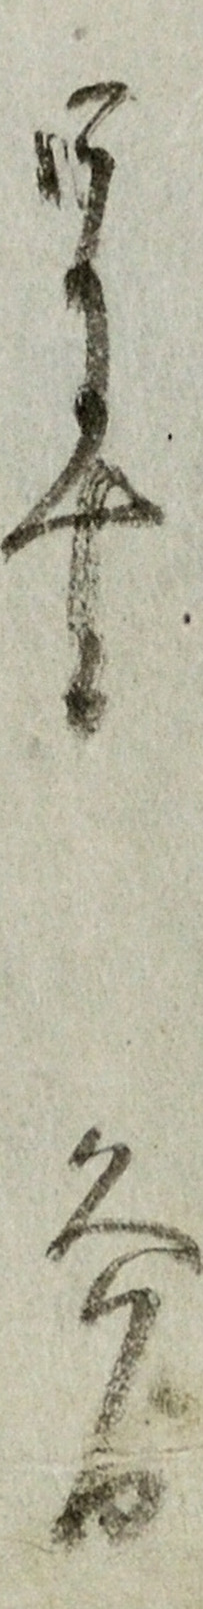四月十日久左衛門
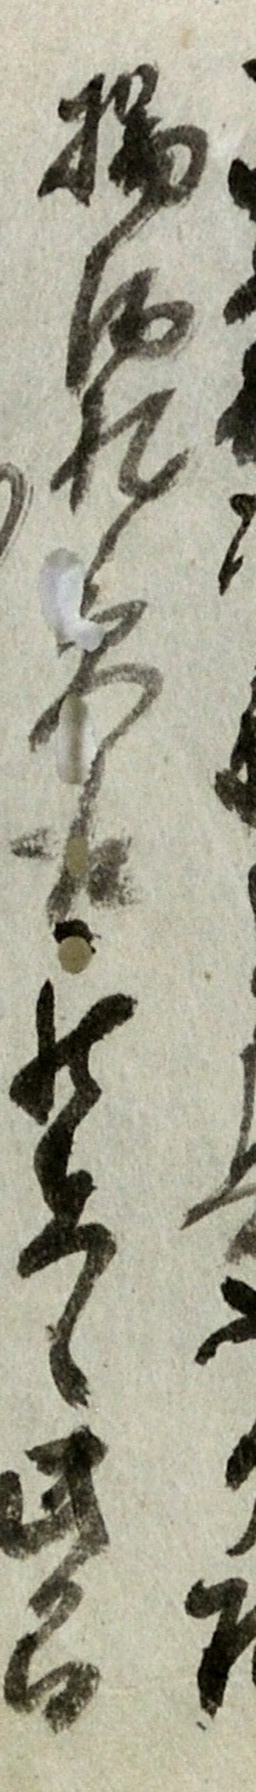揚酒札受取罷出候此間
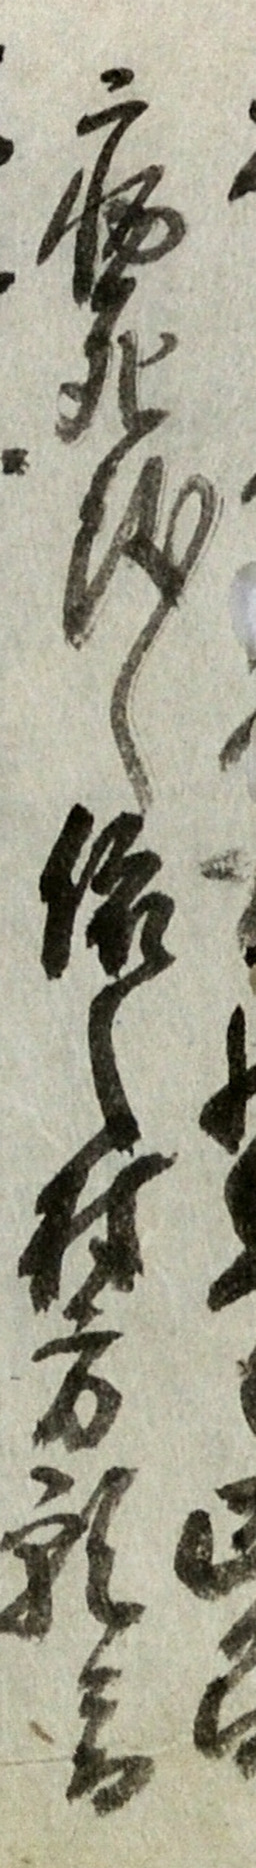病死致候依之村方願ニ而
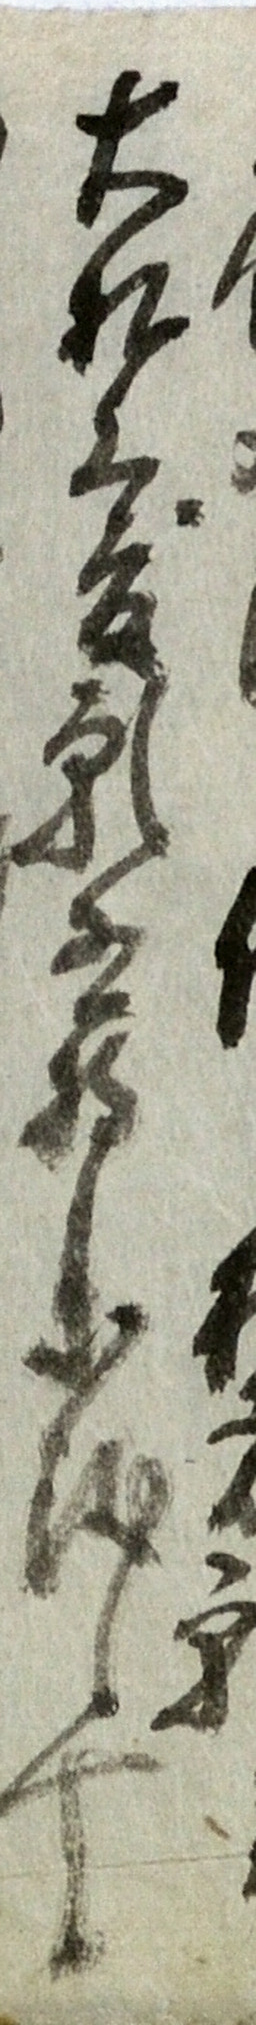右札上度願書持参致候十日
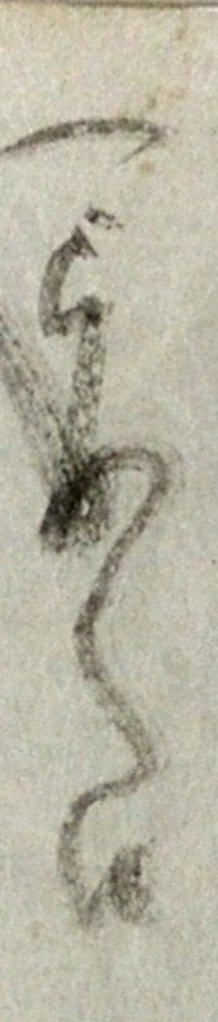可被成候
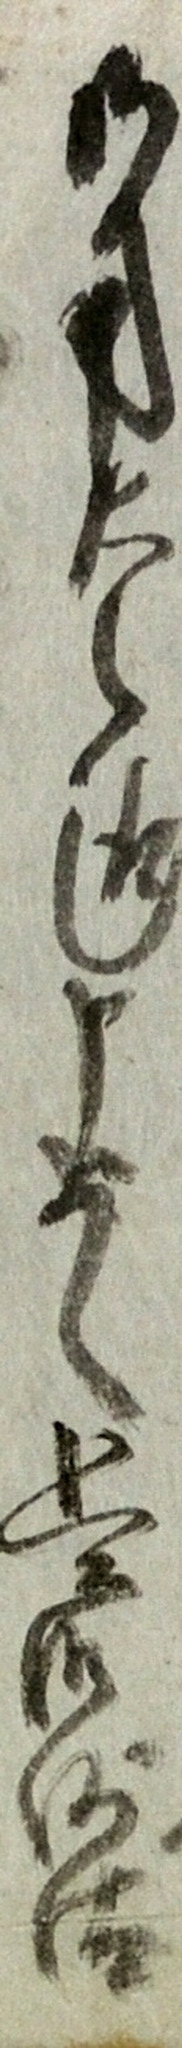御用右之趣申上候追而御沙汰
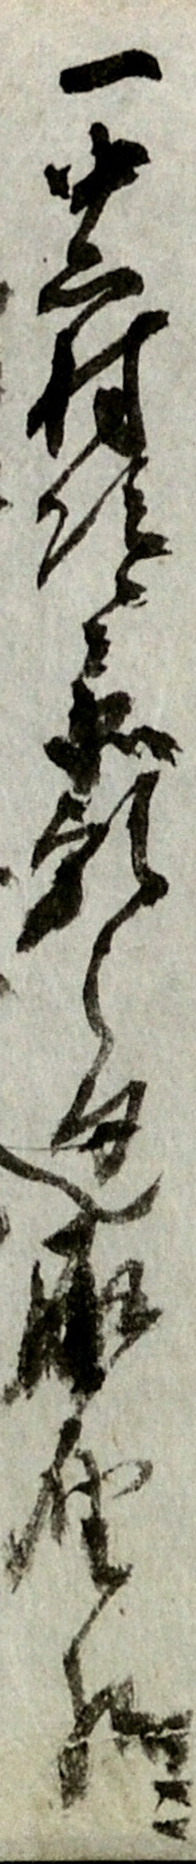一中山村治兵衛願之通承届候様ニ
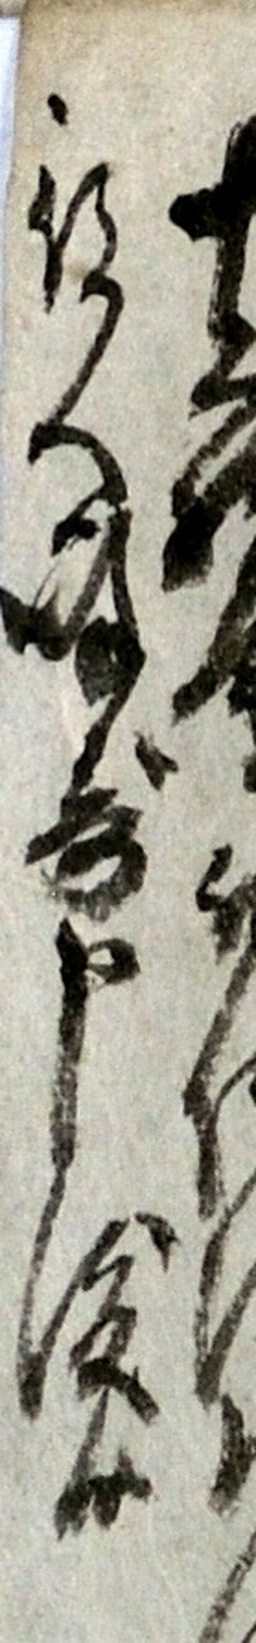役人呼寄申渡候
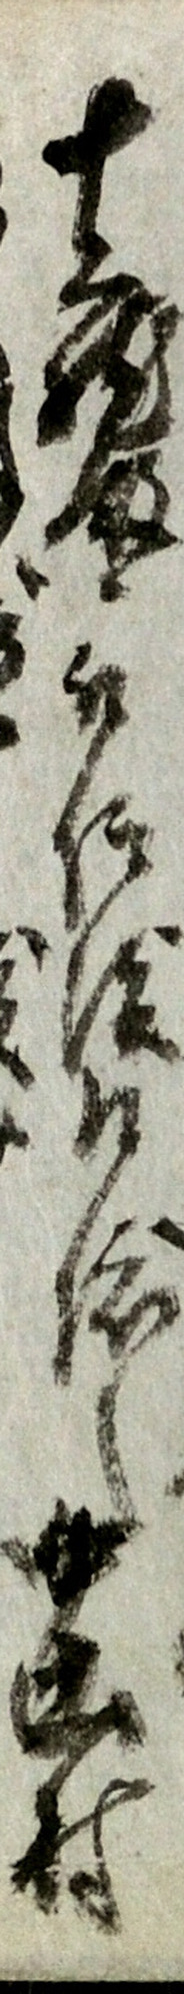十蔵殿被仰渡候依之中山村

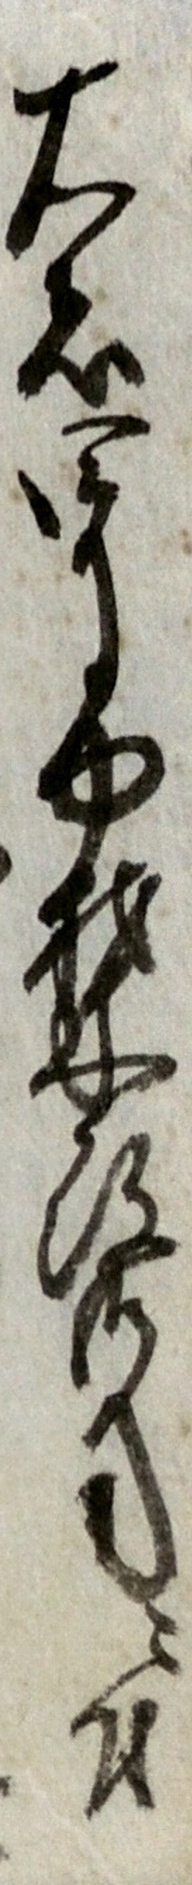右は四月中材木改御用ニ付
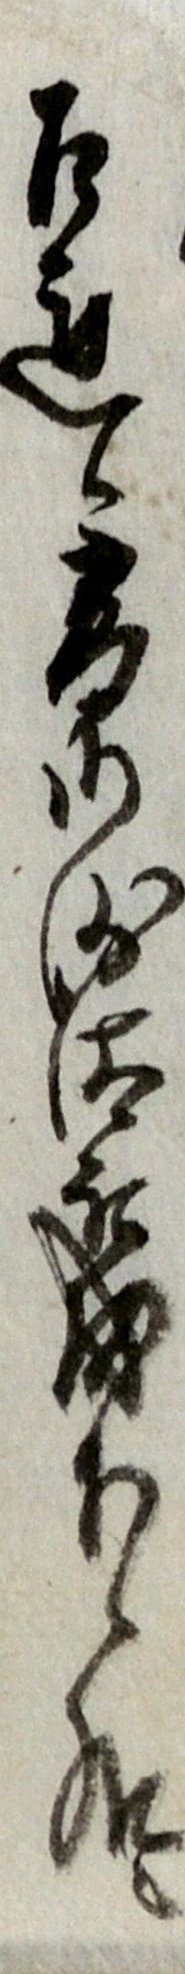召連候御沙汰被成下候様ニ
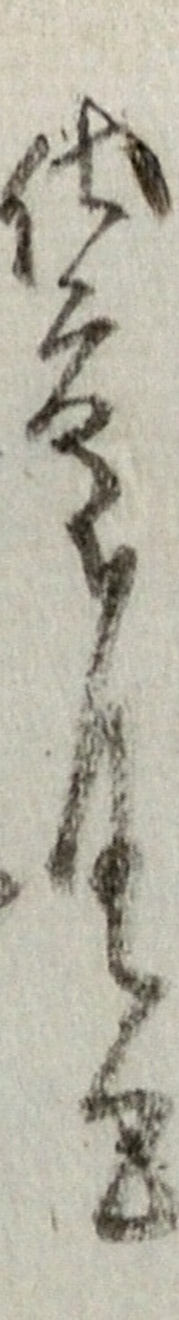仕度奉存候以上
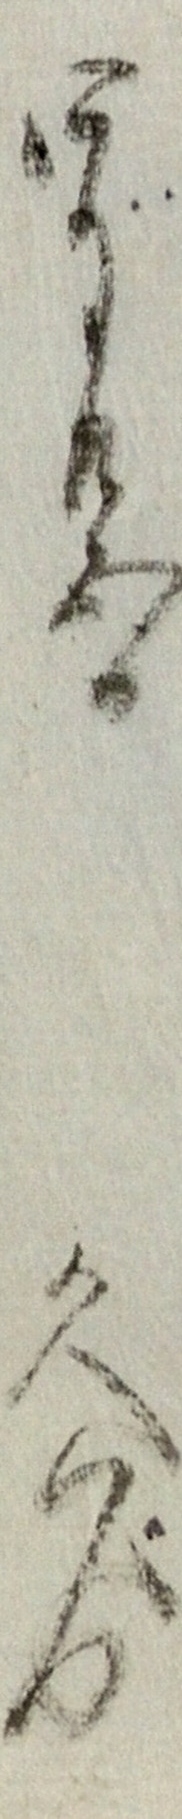四月廿五日久左衛門
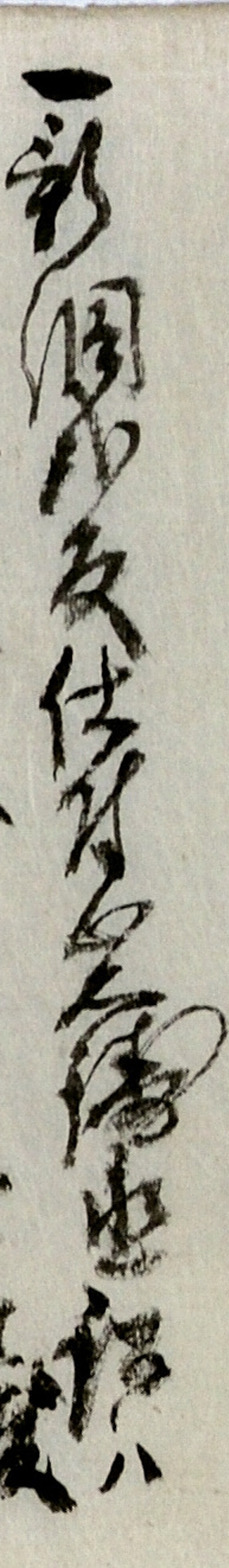一新網弐反仕付岩場直船ハ
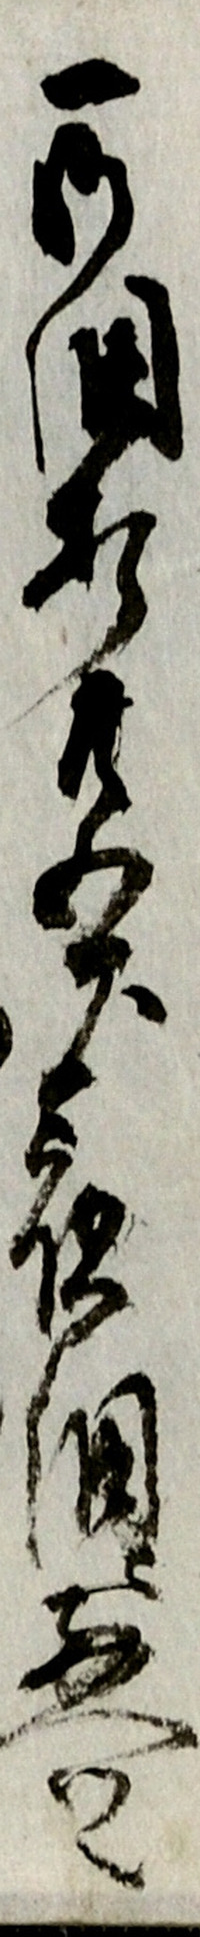一御綱打廿五日ゟ夜網ニ両人ツヽ
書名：分一方諸事御用留帳
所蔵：伊那市立高遠町図書館・合同会社AMANE
